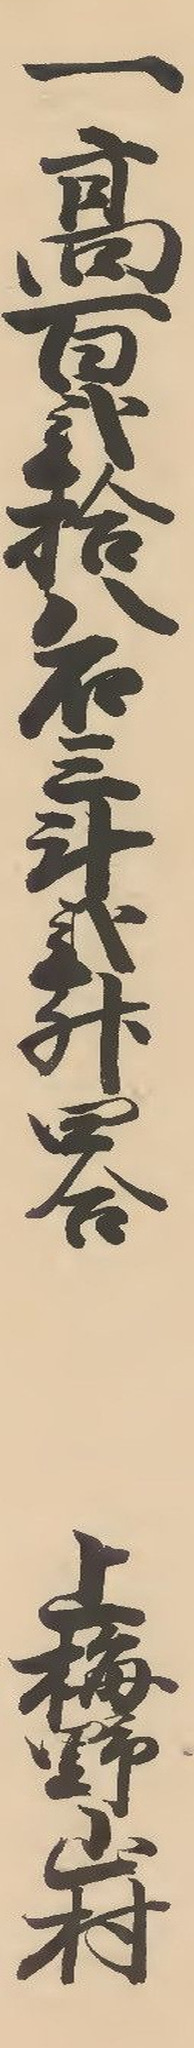一髙百弐拾八石三斗弐升四合上梅野山村
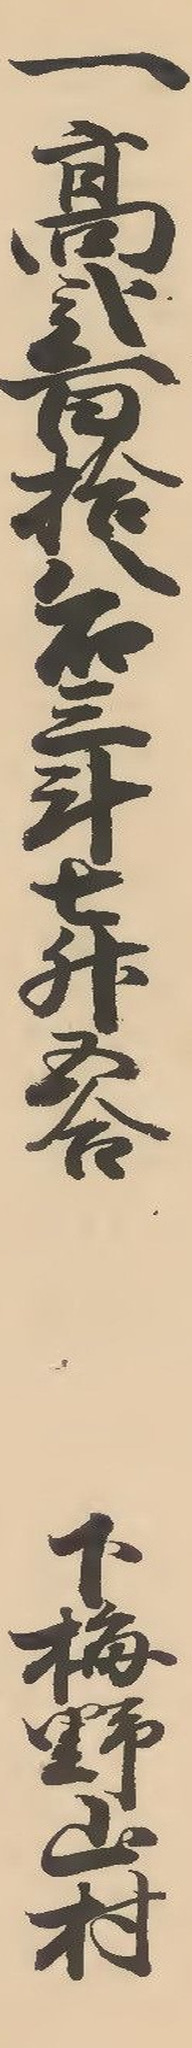一髙弐百拾八石三斗七升五合下梅野山村
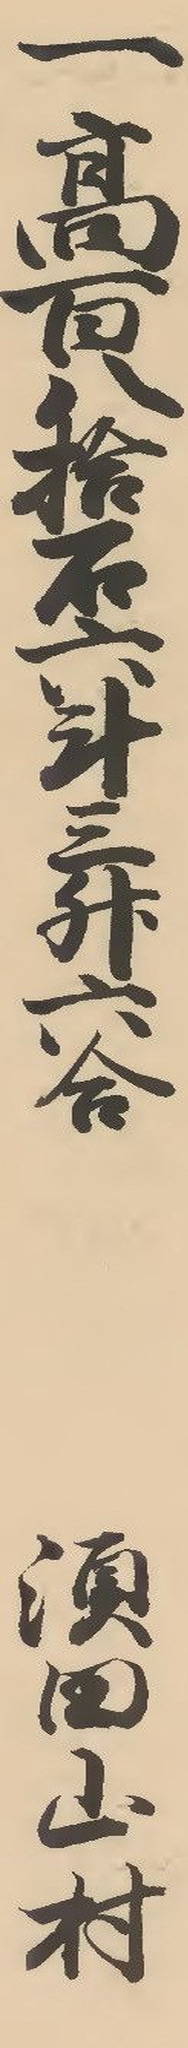一髙百八拾石六斗三升六合須田山村

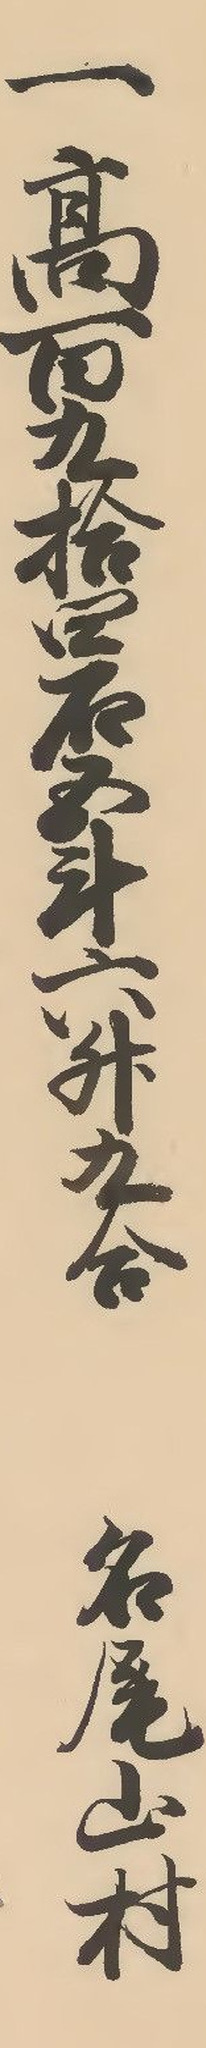一髙百九拾四石五斗六升九合名尾山村
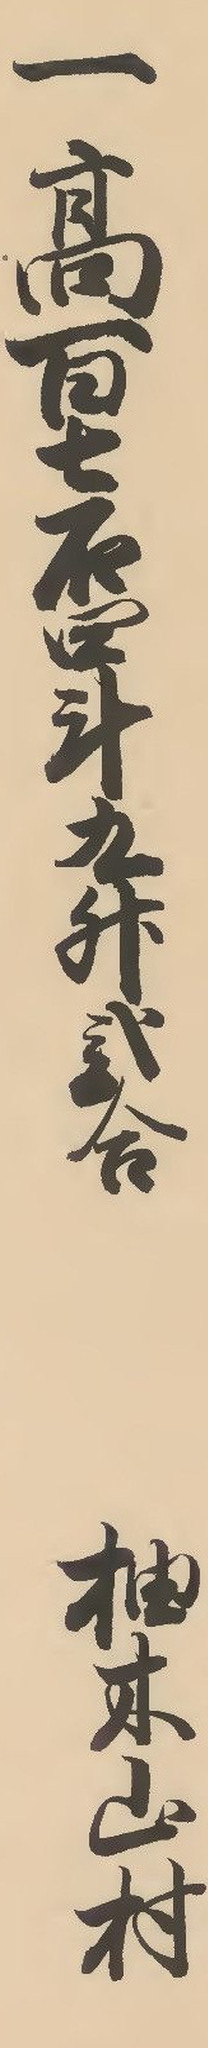一髙百七石四斗九升弐合柚木山村
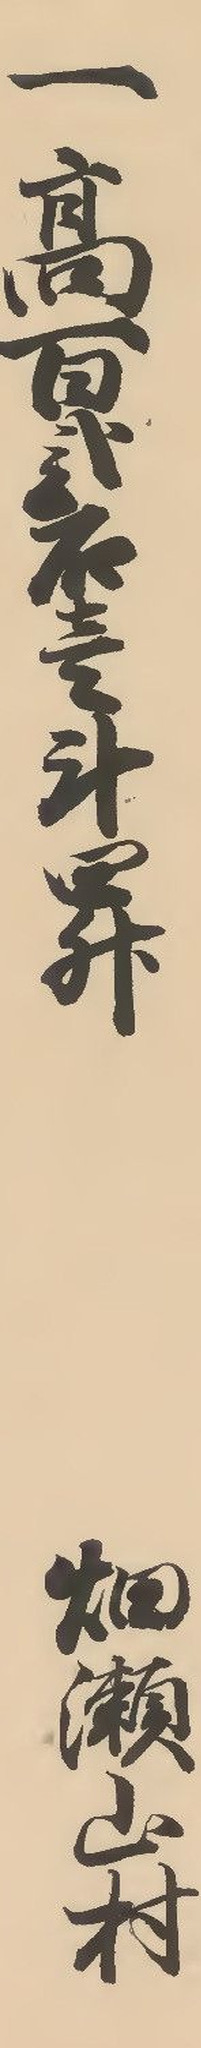一髙百弐石壱斗四升畑瀬山村
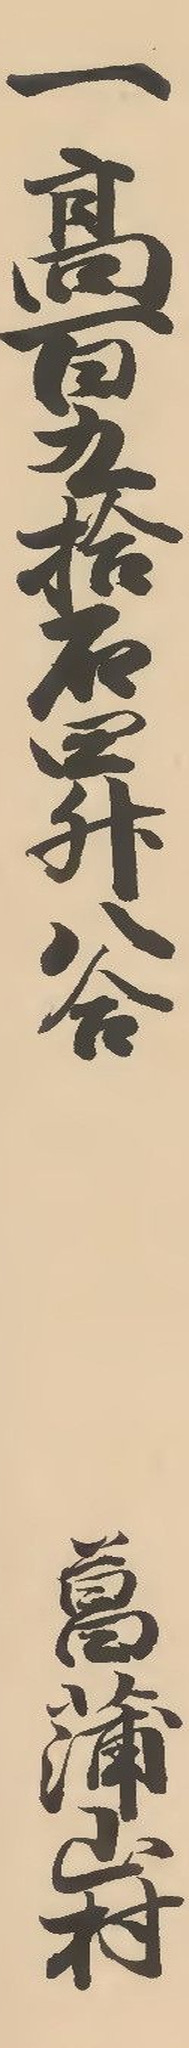一髙百九拾石四升八合菖蒲山村
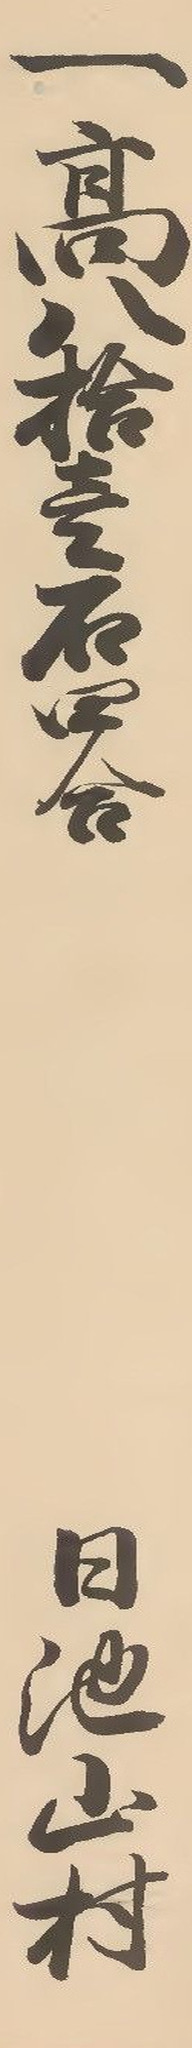一髙八拾壱石四合日地山村
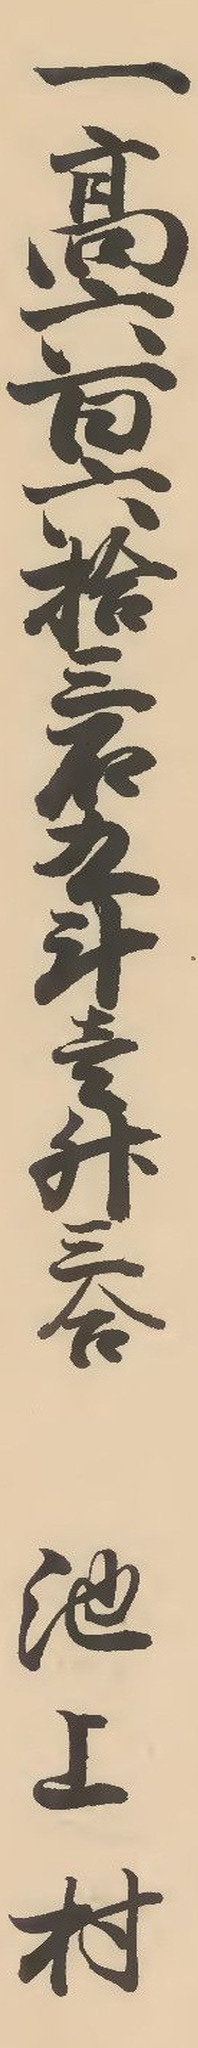一髙六百六拾三石九斗壱升三合池上村
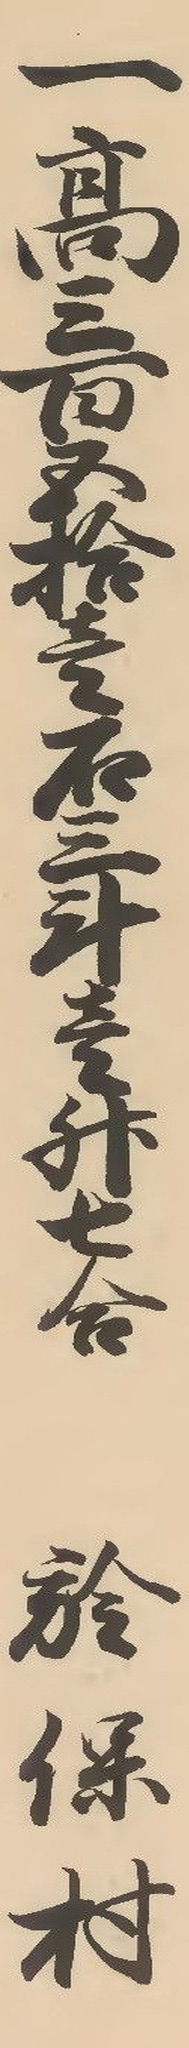一髙三百五拾壱石三斗壱升七合於保村

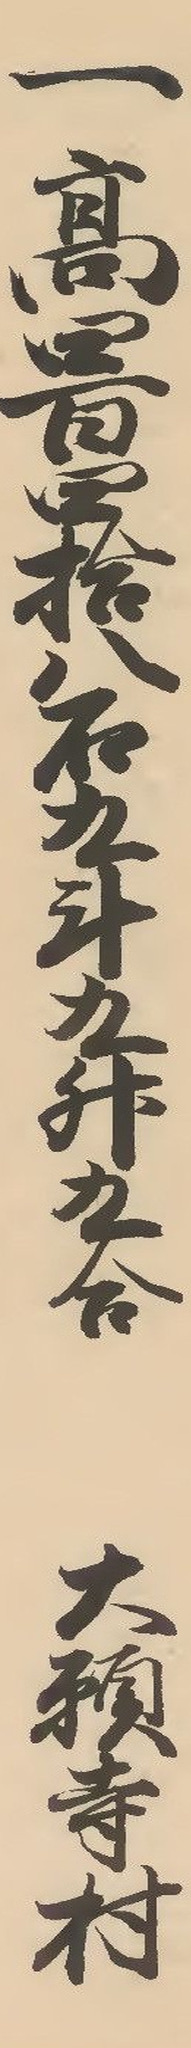一髙四百四拾八石九斗九升九合大願寺村
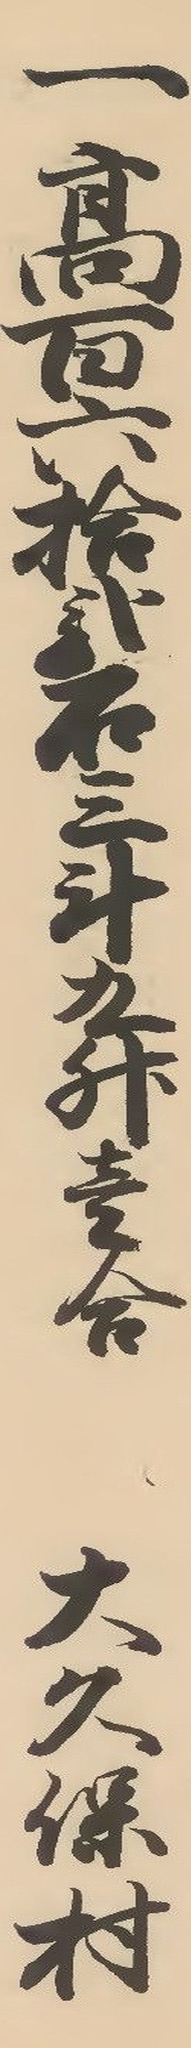一髙百六拾弐石三斗九升壱合大久保村
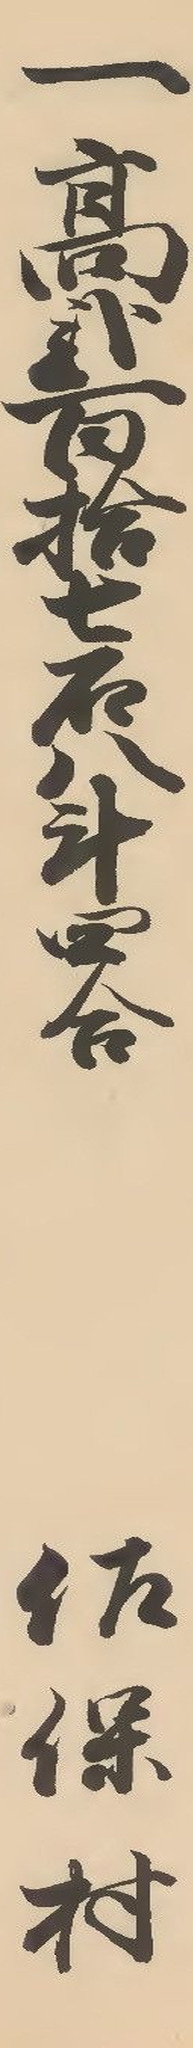一髙弐百拾七石八斗四合佐保村
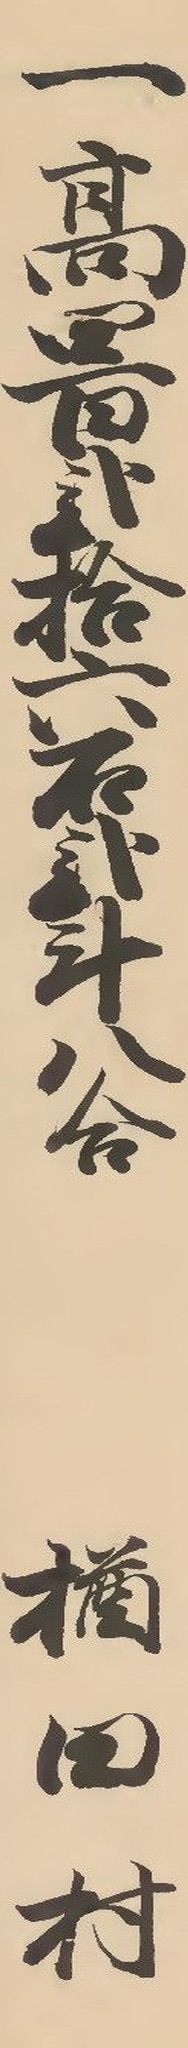一髙四百弐拾六石弐斗八合楢田村
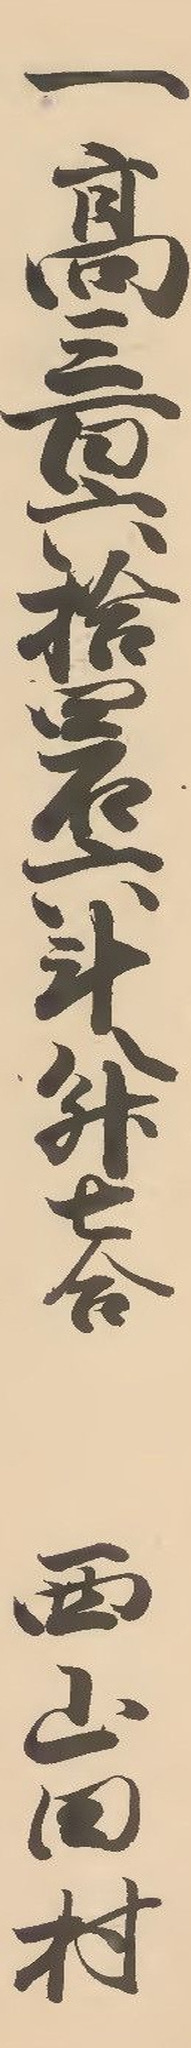一髙三百六拾四石六斗八升七合西山田村
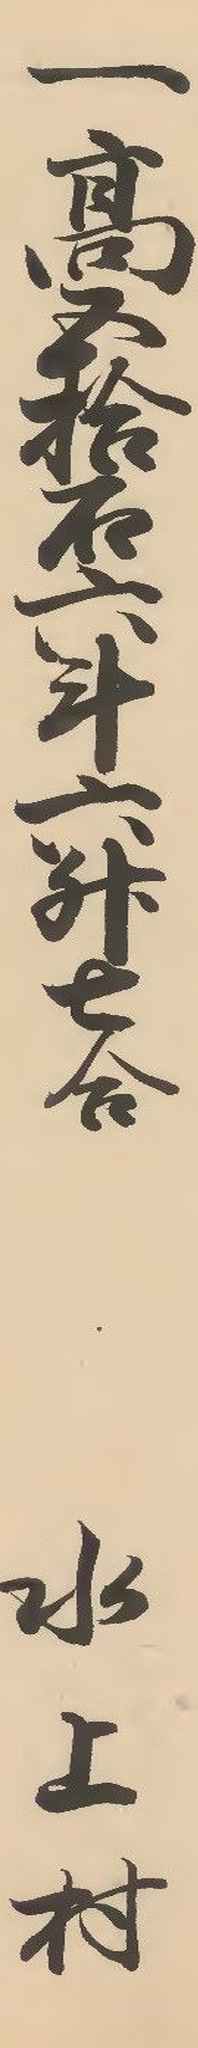一髙五拾石六斗六升七合水上村
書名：肥前国郷帳
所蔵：国立公文書館 National Archives of Japan
